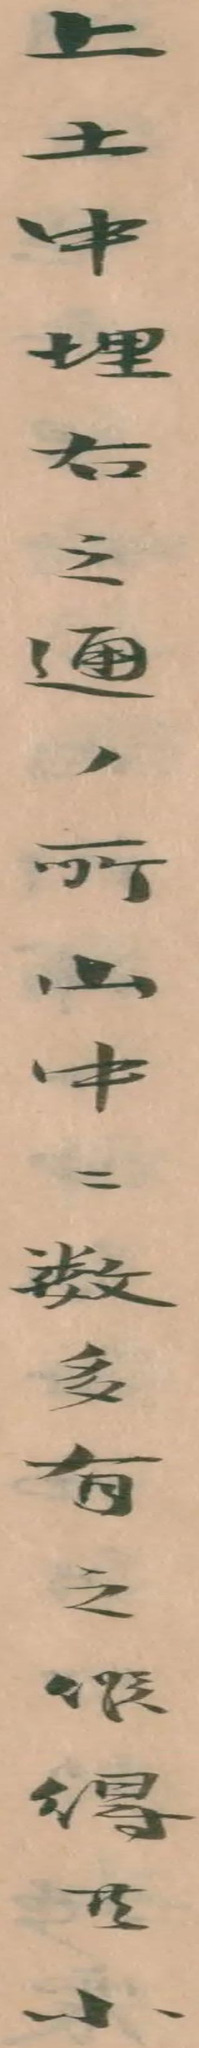上土中埋右之通ノ所山中ニ数多有之候得共小
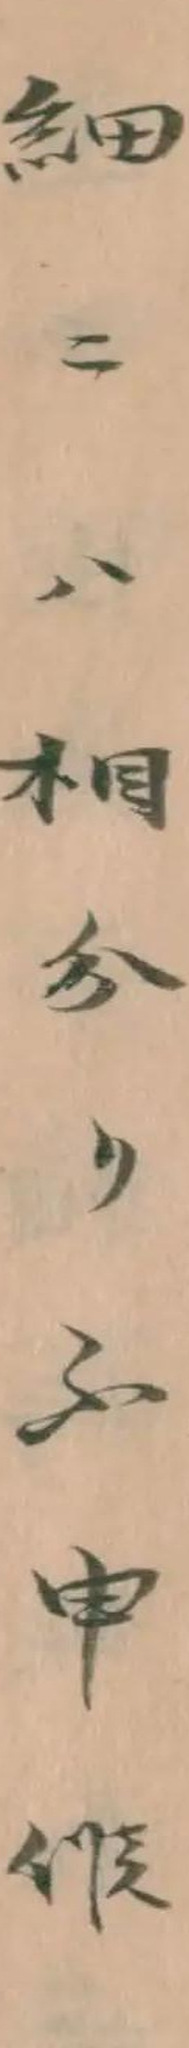細ニハ相分リ不申候
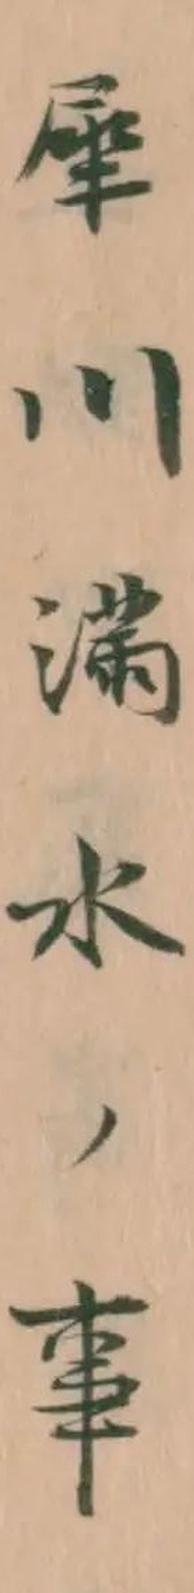犀川満水ノ事
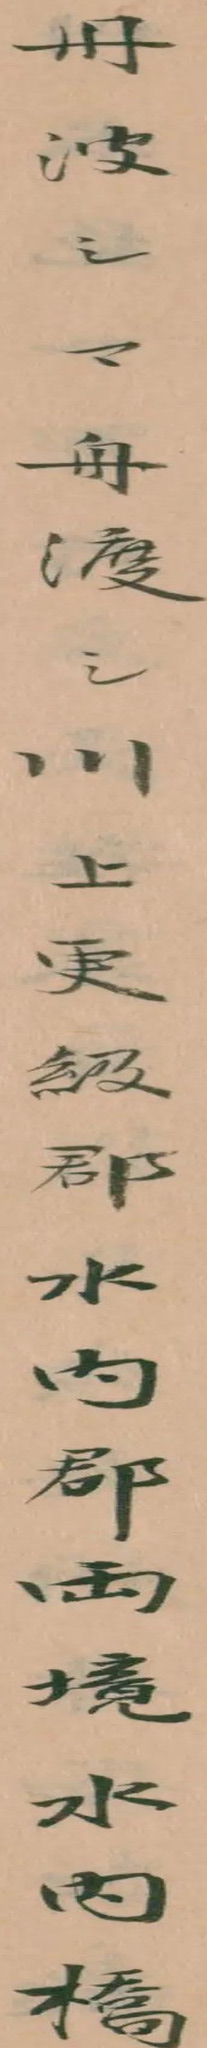丹波シマ舟渡シ川上更級郡水内郡両境水内橋
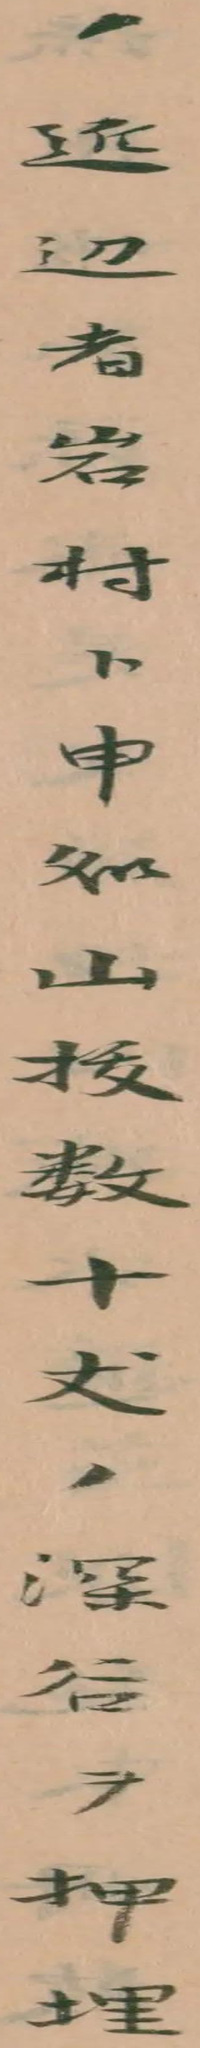ノ近辺者岩村ト申処山抜数十丈ノ深谷ヲ押埋
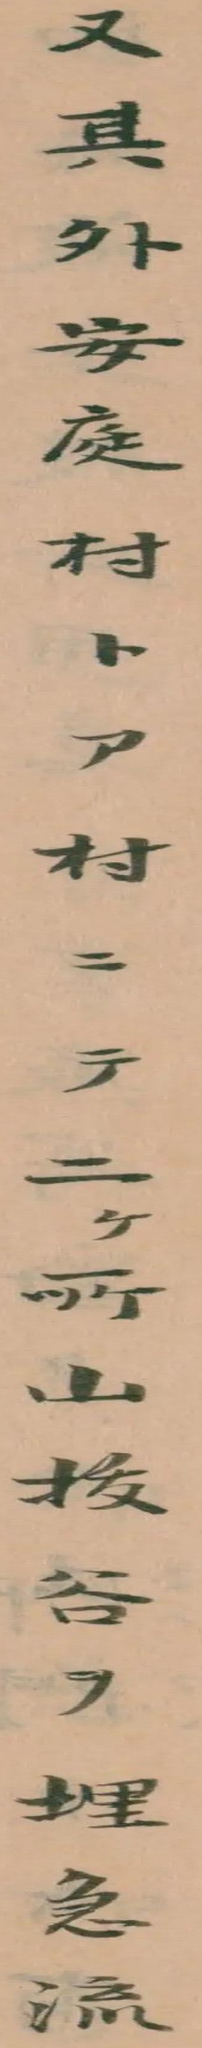又其外安庭村トア村ニテ二ヶ所山抜谷ヲ埋急流
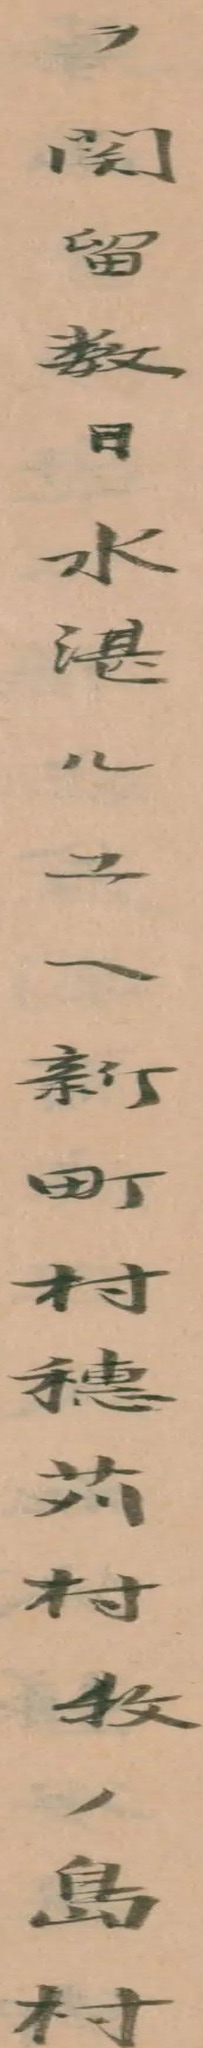ヲ関留数日水湛ルユヘ新町村穂苅村牧ノ島村
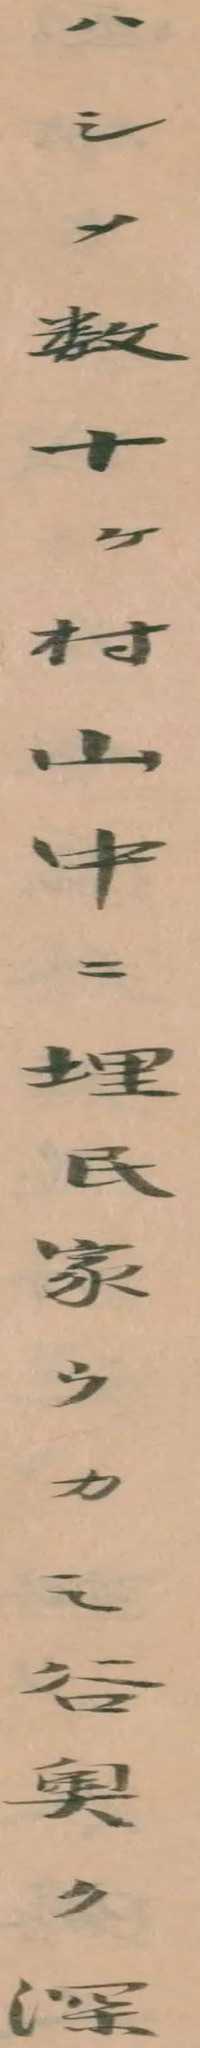ハシメ数十ヶ村山中ニ埋民家ウカミ谷奥ク深
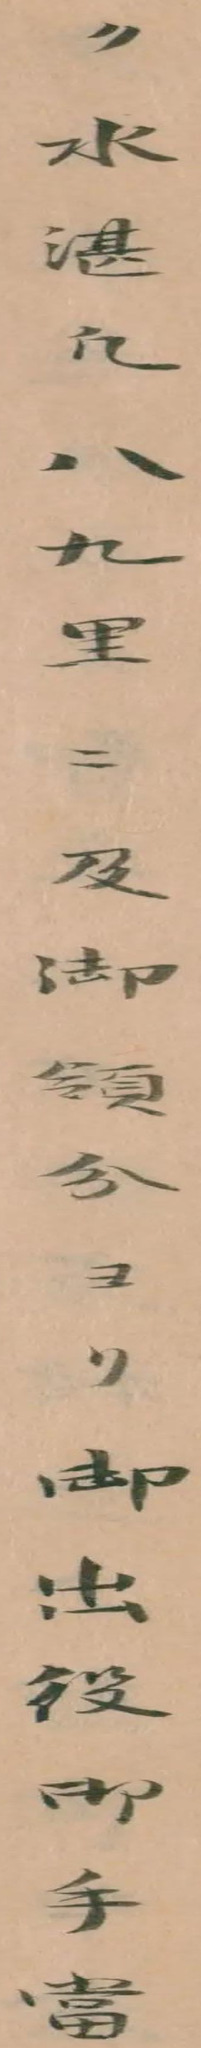ク水湛凡八九里ニ及御領分ヨリ御出役御手当
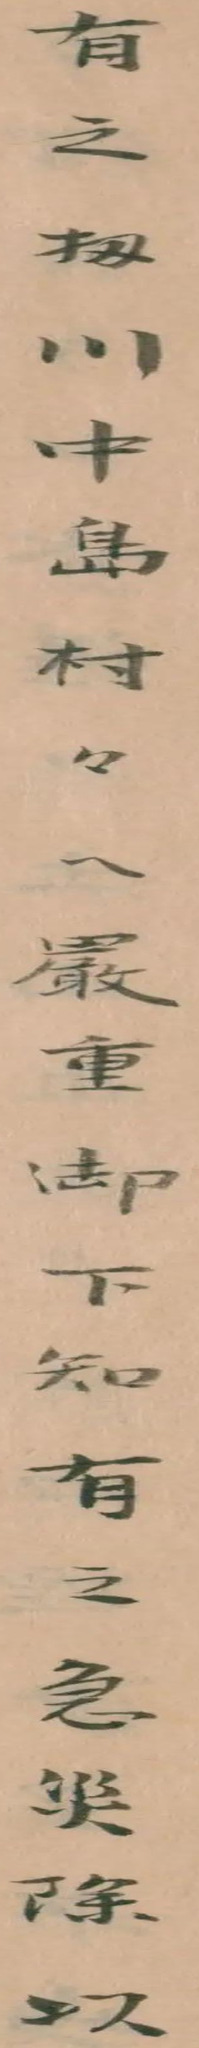有之扨川中島村々ヘ厳重御下知有之急災除以
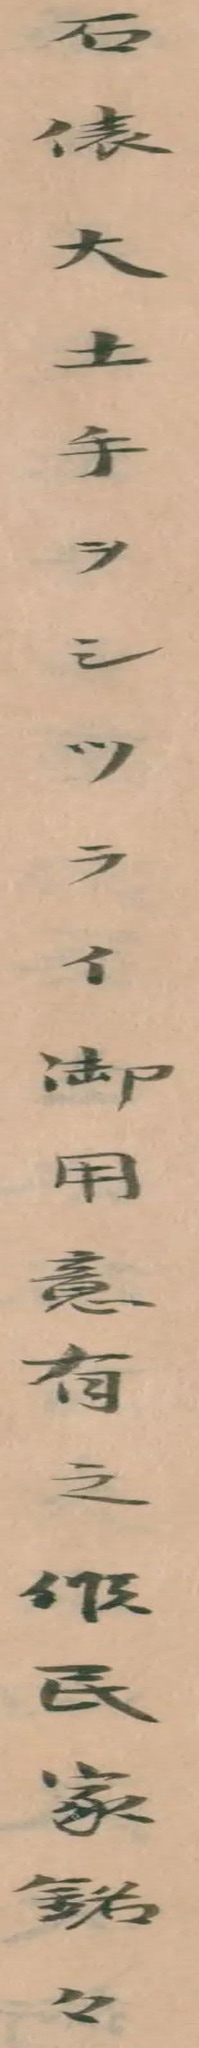石俵大土手ヲシツライ御用意有之候民家銘々
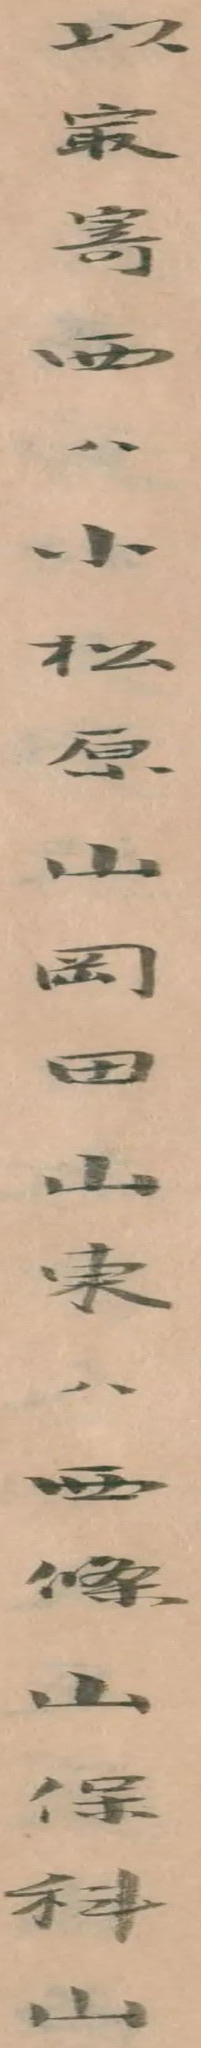以最寄西ハ小松原山岡田山東ハ西條山保科山
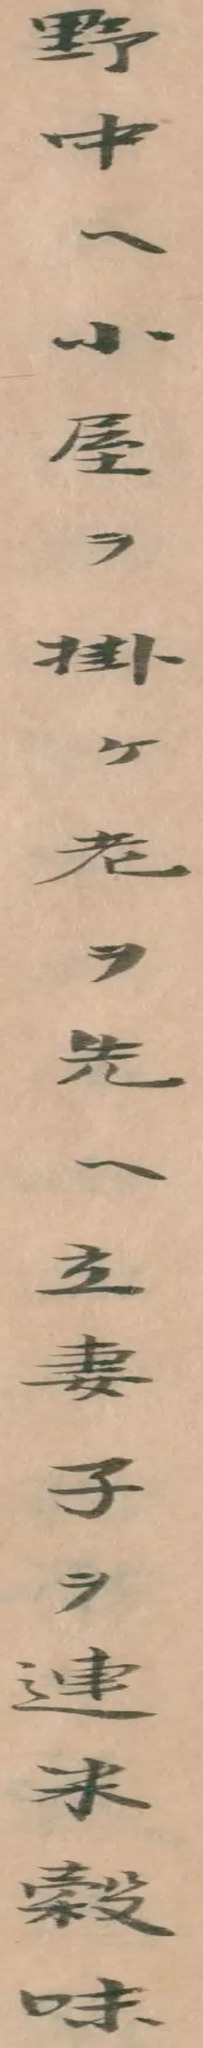野中ヘ小屋ヲ掛ケ老ヲ先ヘ立妻子ヲ連米穀味
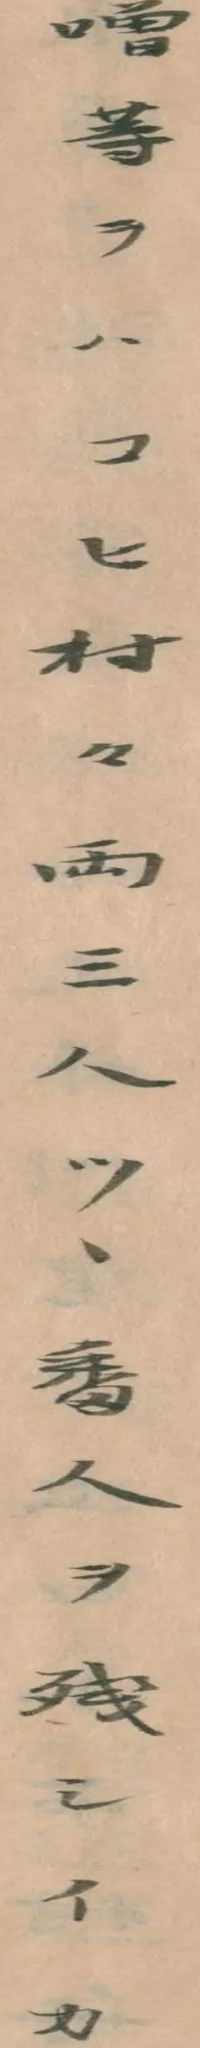噌等ヲハコヒ村々両三人ツヽ番人ヲ残シイカ
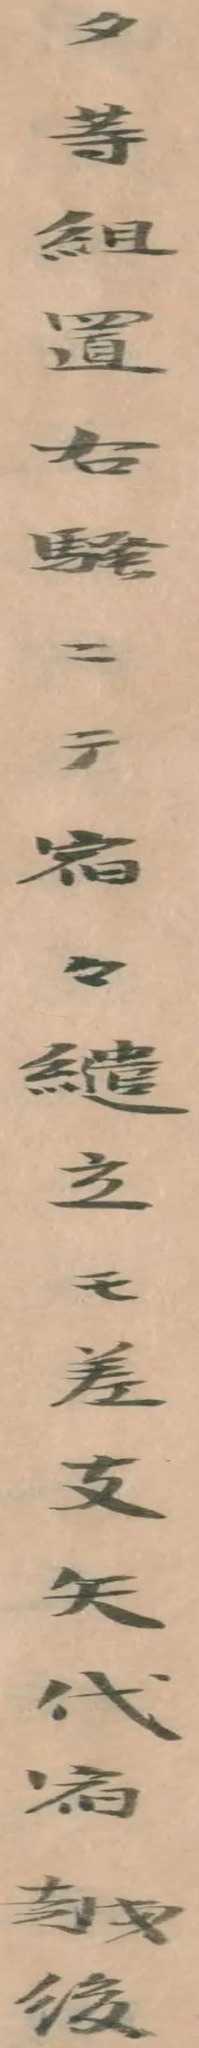タ等組置右騒ニテ宿々繾立モ差支矢代宿越後

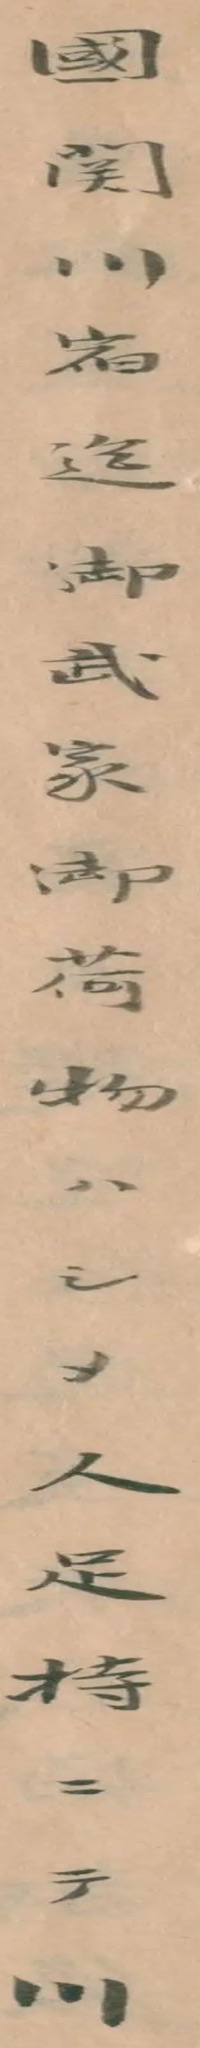国関川宿迄御武家御荷物ハシメ人足持ニテ川
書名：地災撮要. 巻5-6(地震之部)
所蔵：国立国会図書館 National Diet Library, JAPAN
